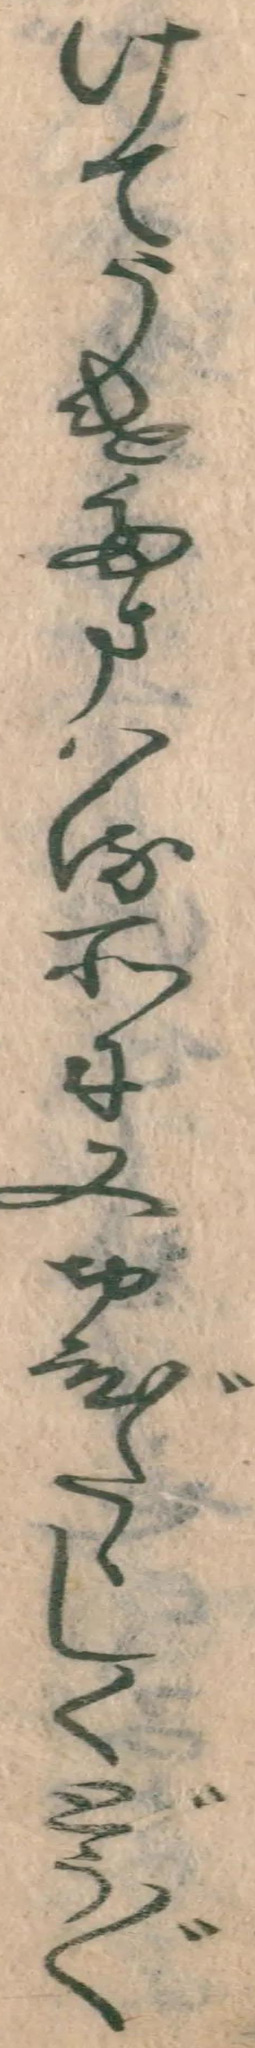けてうけたまはる所に又おびたゝしくどう〴〵
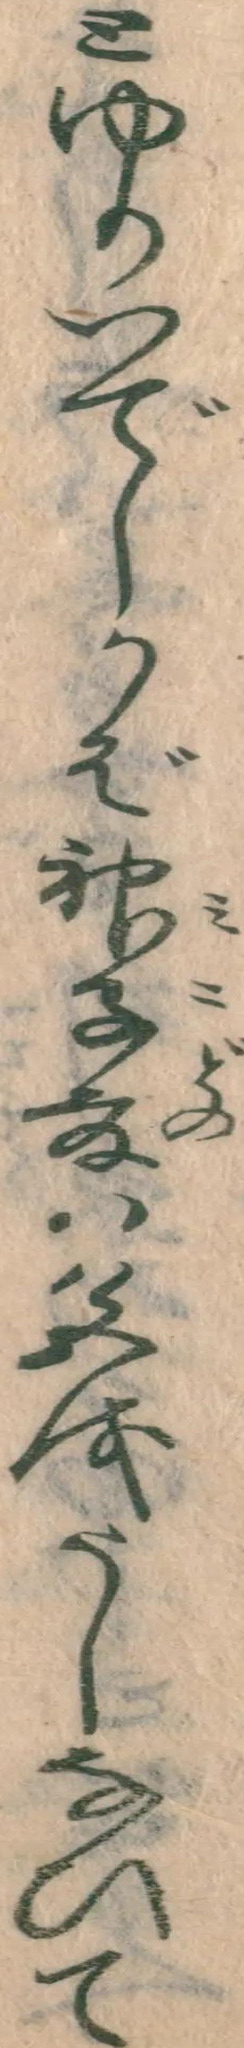とゆりいでしかぞ神子殿は色をうしなひて
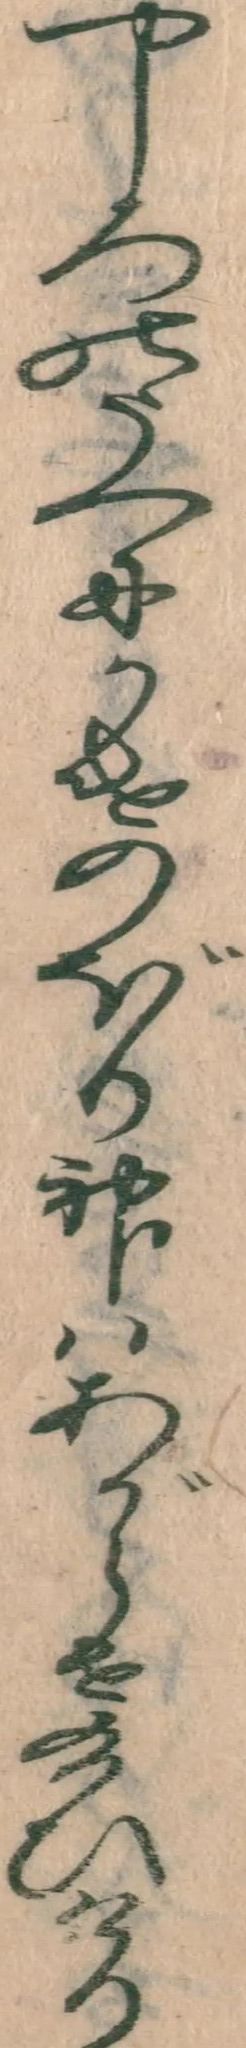やしろのうへにかけのぼり神はあがらせ給ひけり
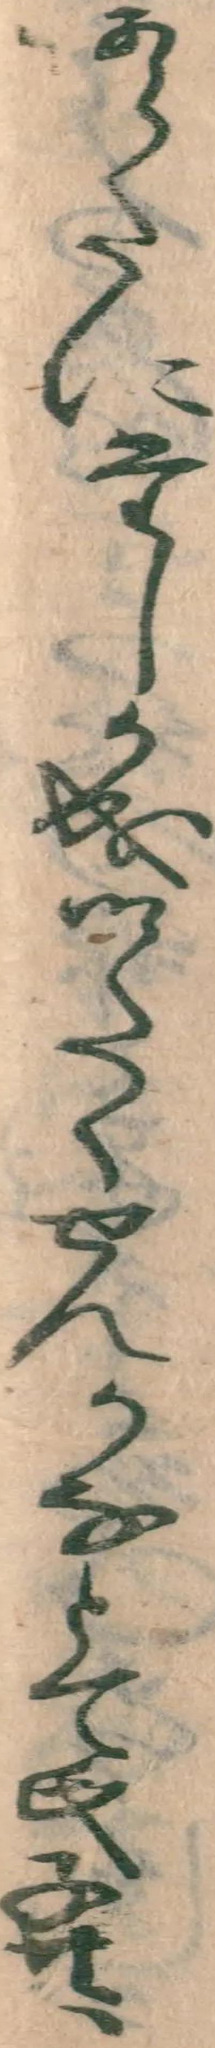あらたにたしか成御たくせんかなとて氏子共は
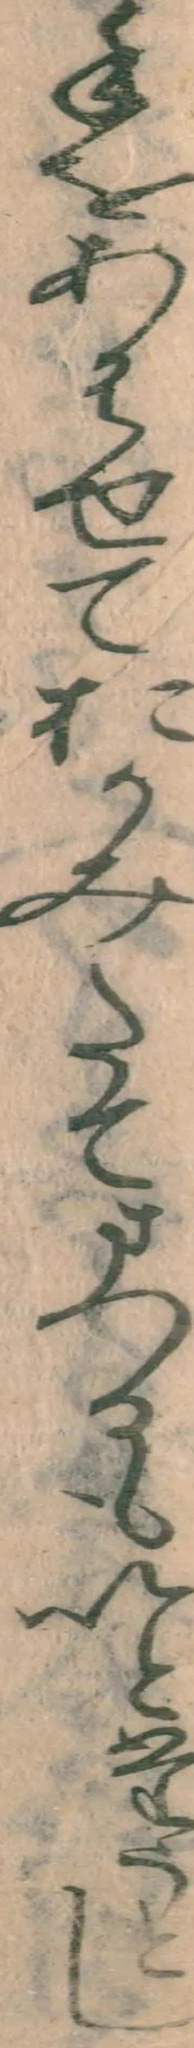手をあはせておかみたてまつるもいとたうとし
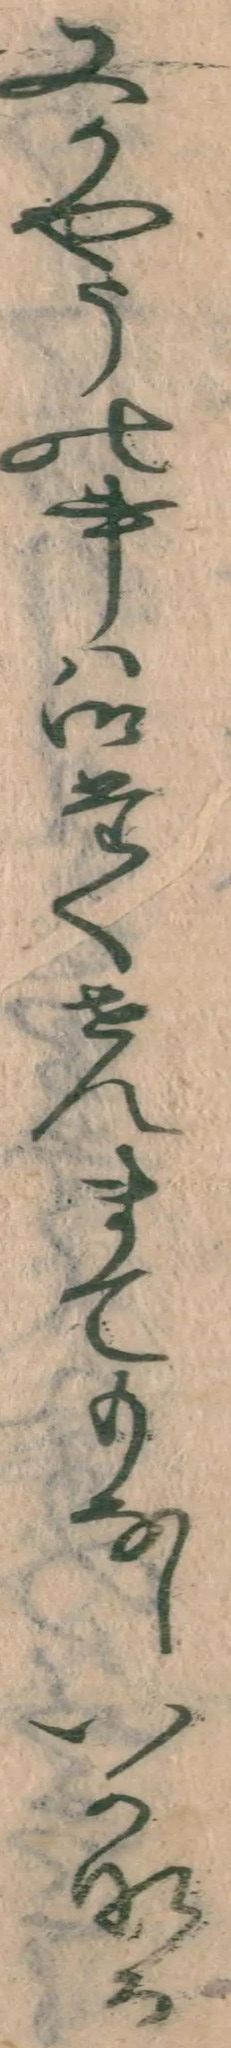又かやうの事は御たくせんまてもなしいかなる
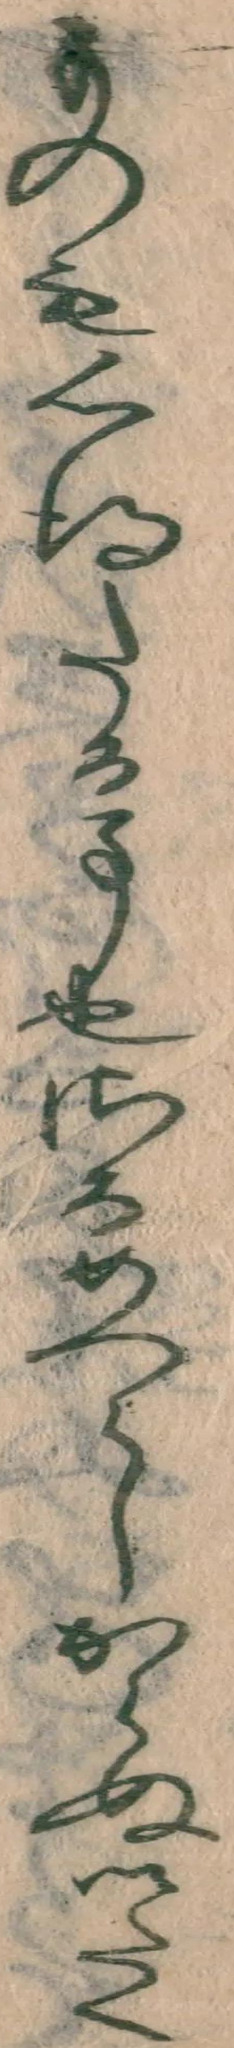ものも心持たる事也さるめつらしからぬ御たく
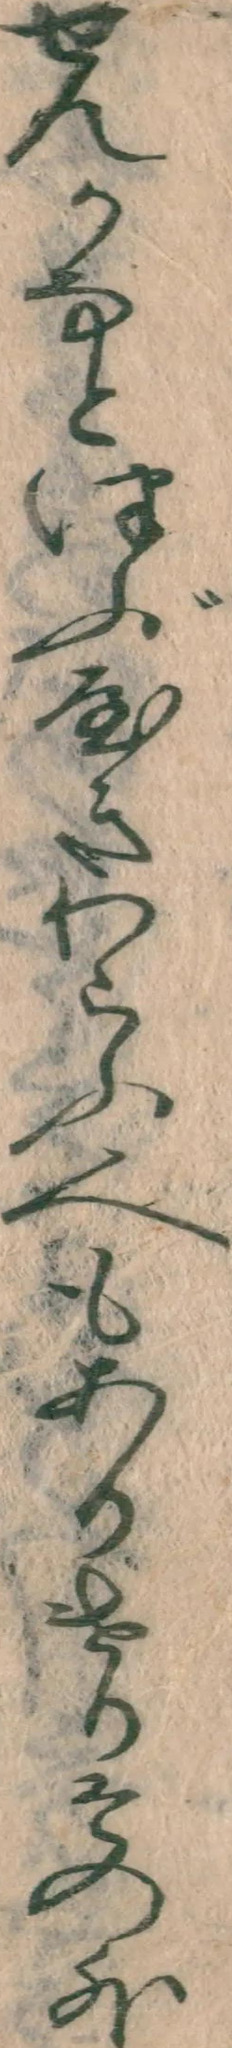せんかなとつぶやきわらふ人もありけりその外
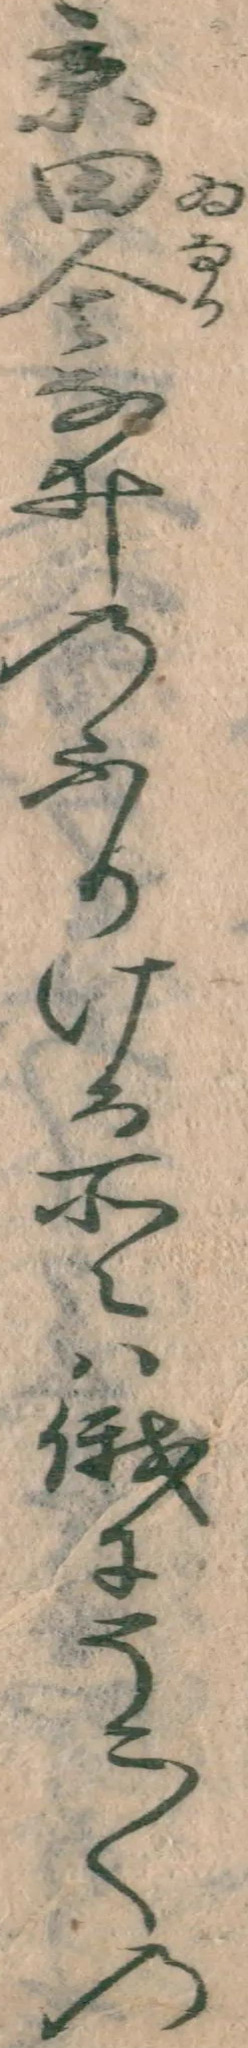京田舎なゐのふりける所には俄にそこ〳〵の
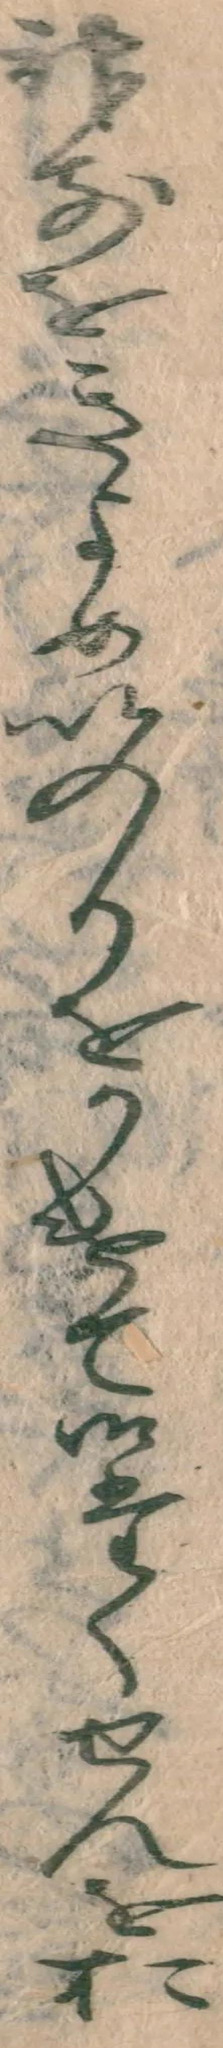神前をきよめいのりをかけて御たくせんをお
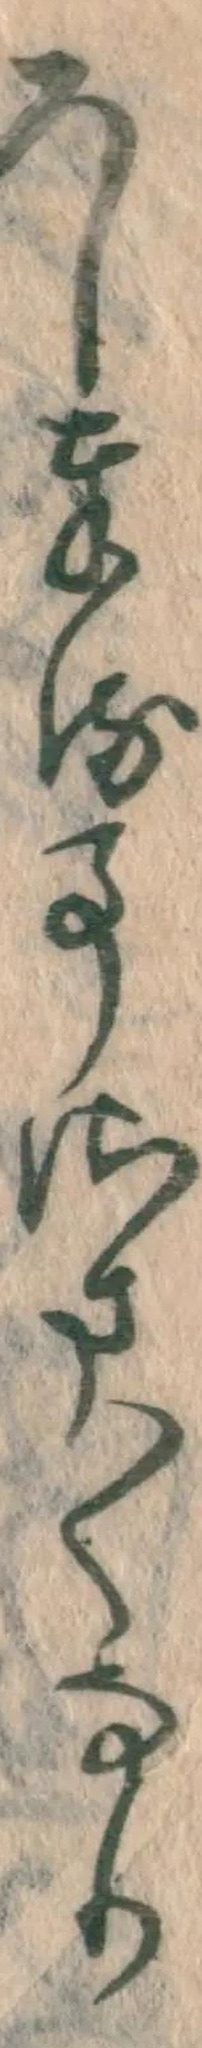ろし奉る事さま〳〵なり
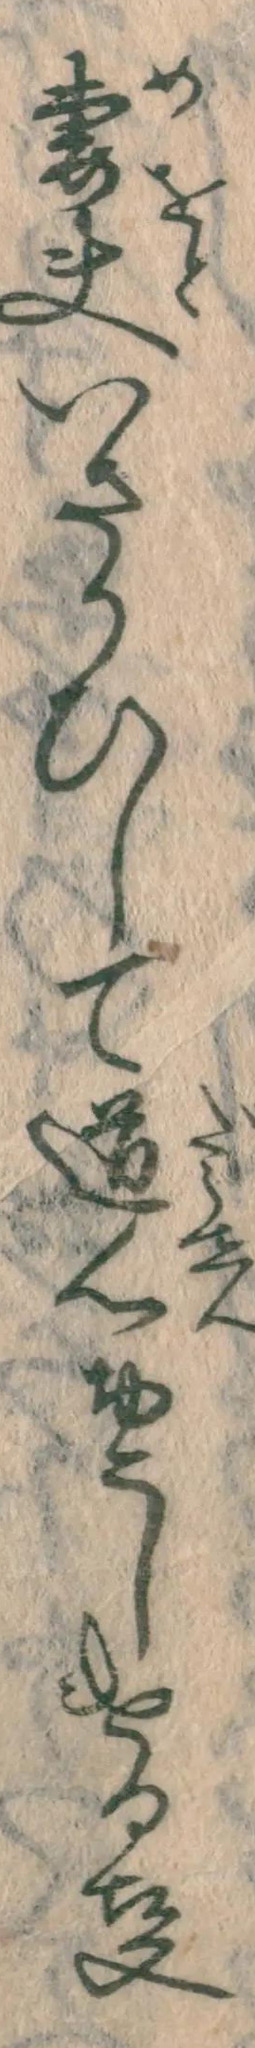三妻夫いさかひして道心おとしける事
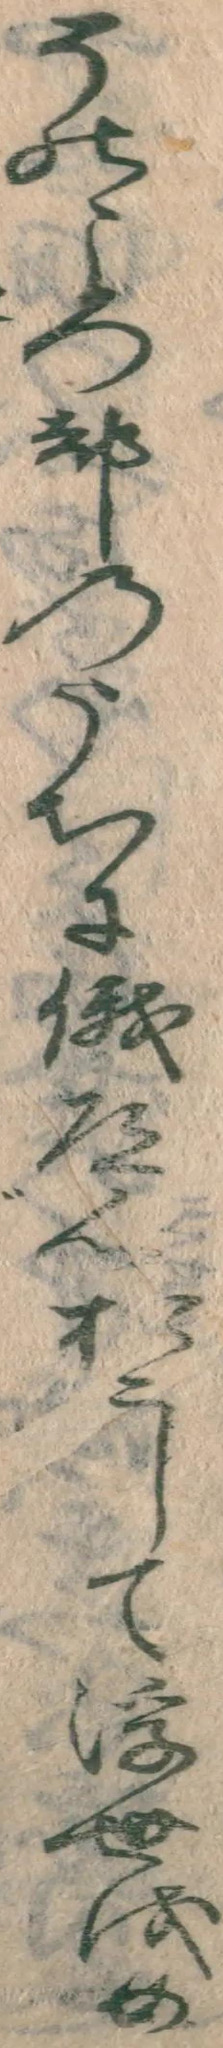そのころ都のうちに俄へんおこして浮世をめ
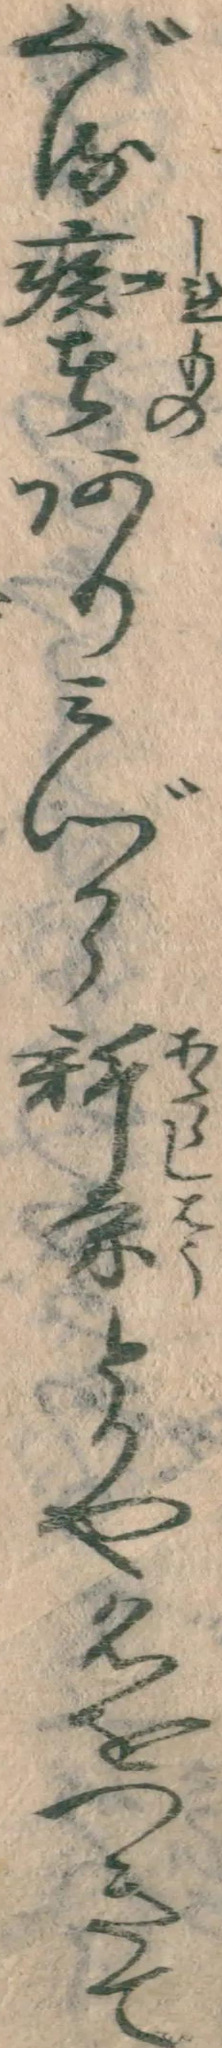ぐる痴者ありみづから新房とかや名をつきて
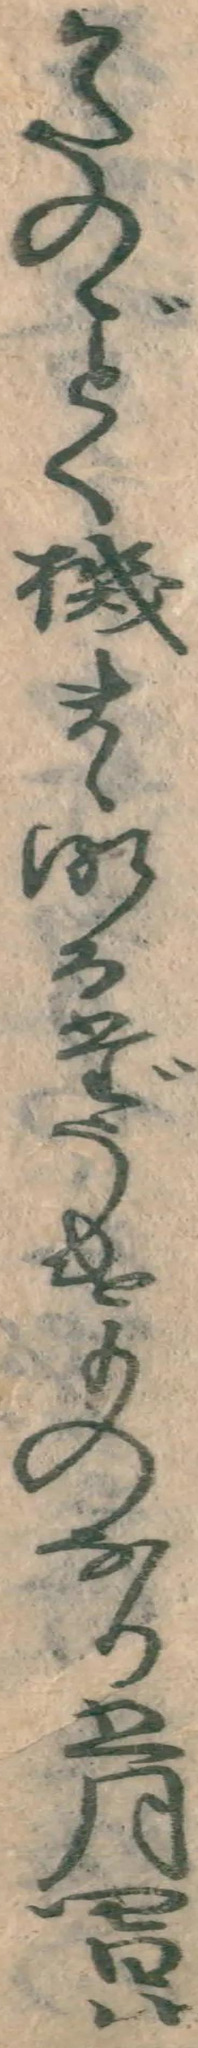かたのごとく機まゝなるだうけものなり五月四日は

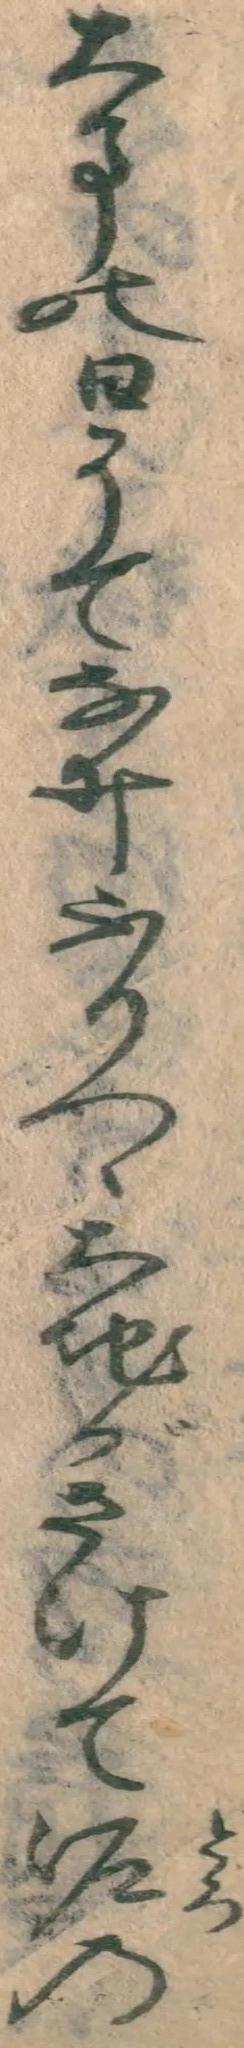大事の日にてなゐふりつゝ大地がさけて泥の
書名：艱難目異志. 上,下
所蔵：国立国会図書館 National Diet Library, JAPAN
